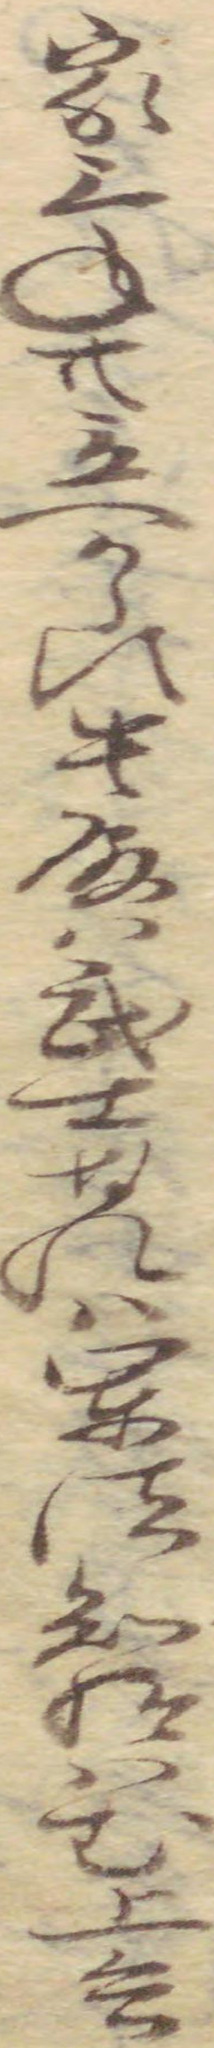家三年共立へからす貴殿は武士なれは軍法知給はむ上兵
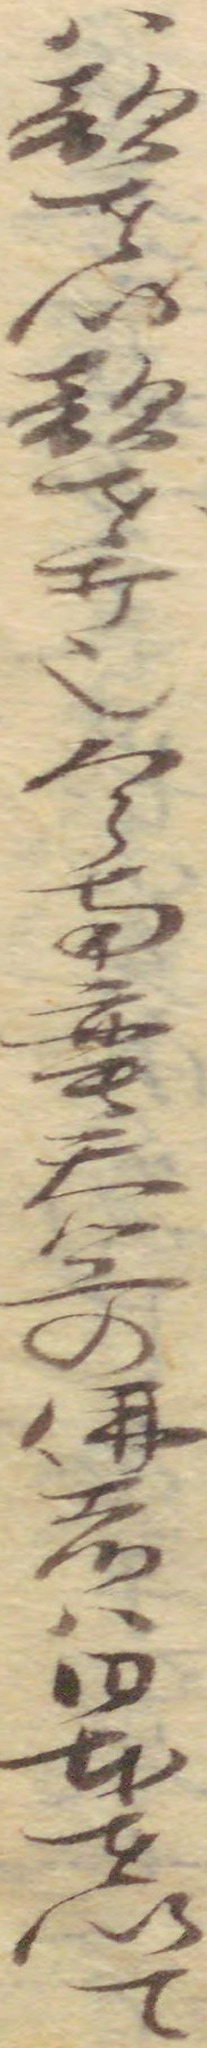は敵を以敵を打也今南蛮天竺の仏者は日本を以て
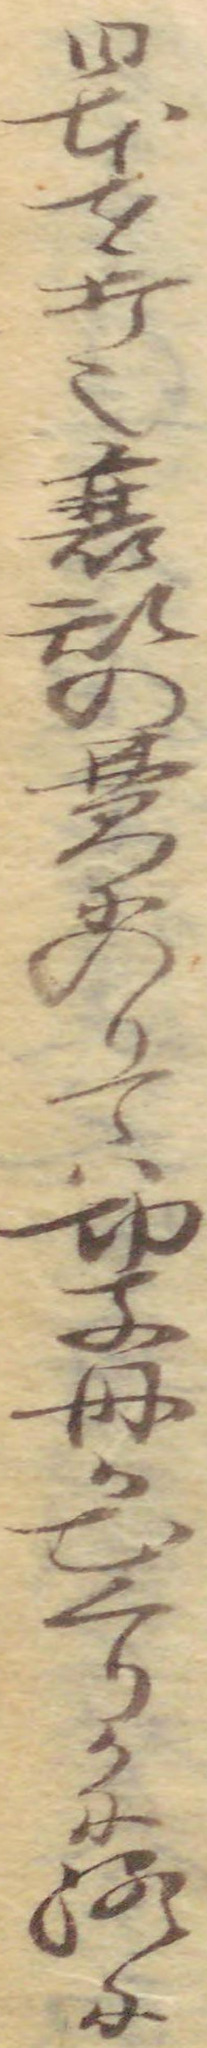日本を打也衰乱の費にのりては切支丹かむくりかに終に

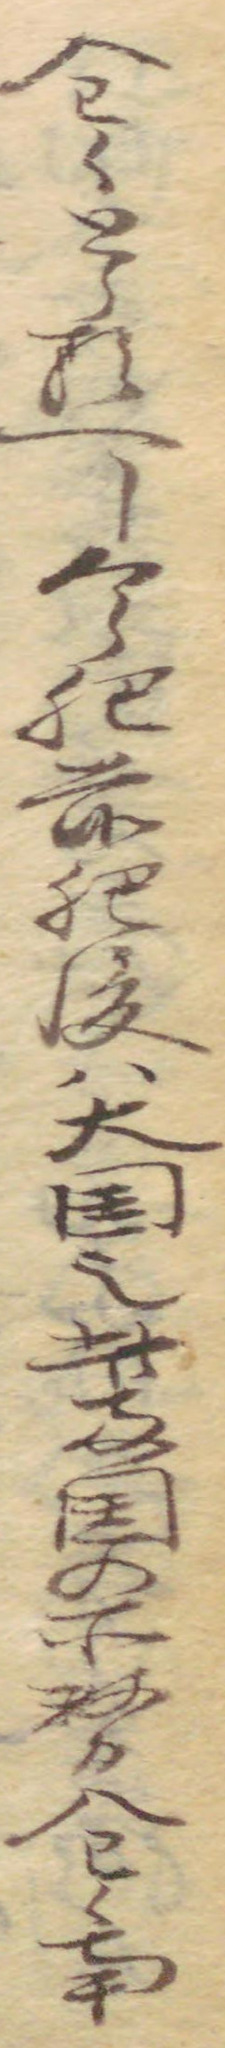全くとらるへし今肥前肥後は大国也此両国の所務全く南
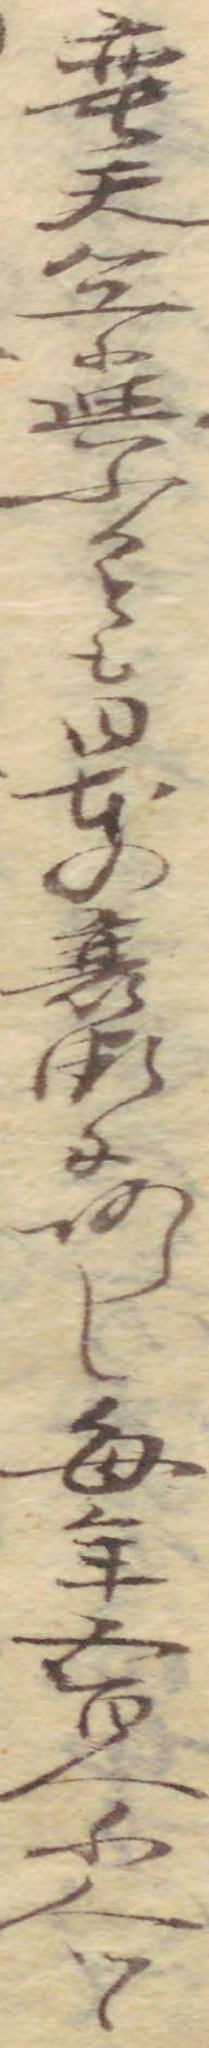蛮天竺に与ふるとも日本の衰微にあらし毎年五百人千人ツヽ
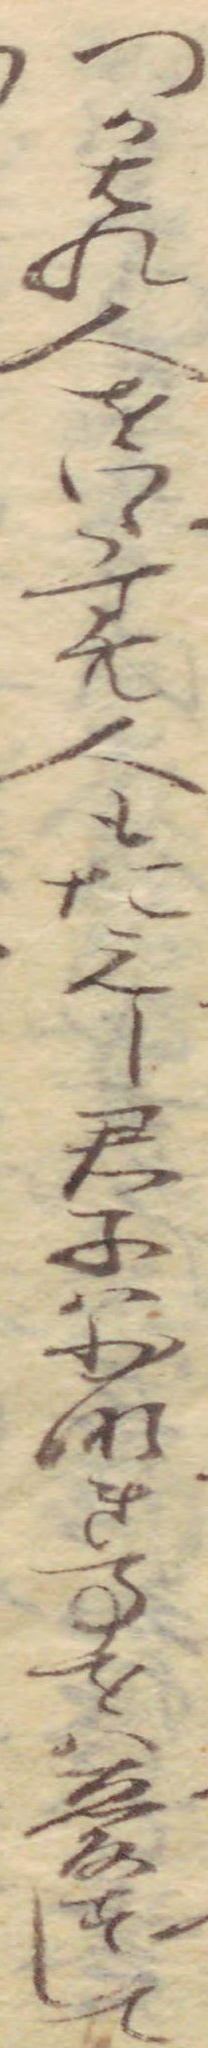つかはれ人をわたす共人もたえし君子は少なき事をは憂すして
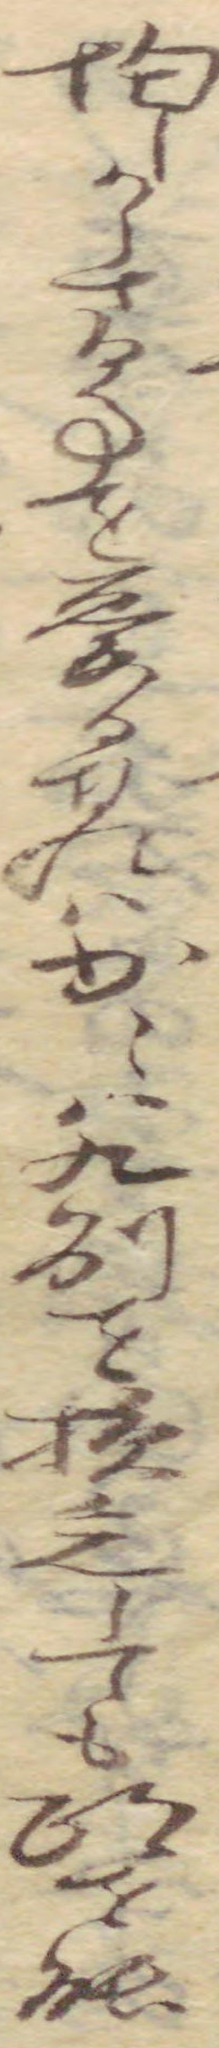均しからさる事を憂るなれは少〻は九州を損乏しても跡を能
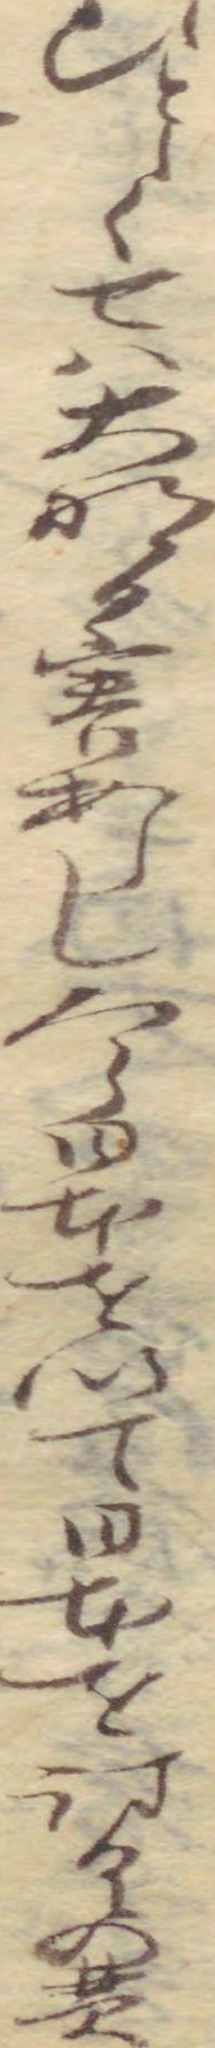ひとしくせは大なる害ならし今日本を以て日本を討る〻の費
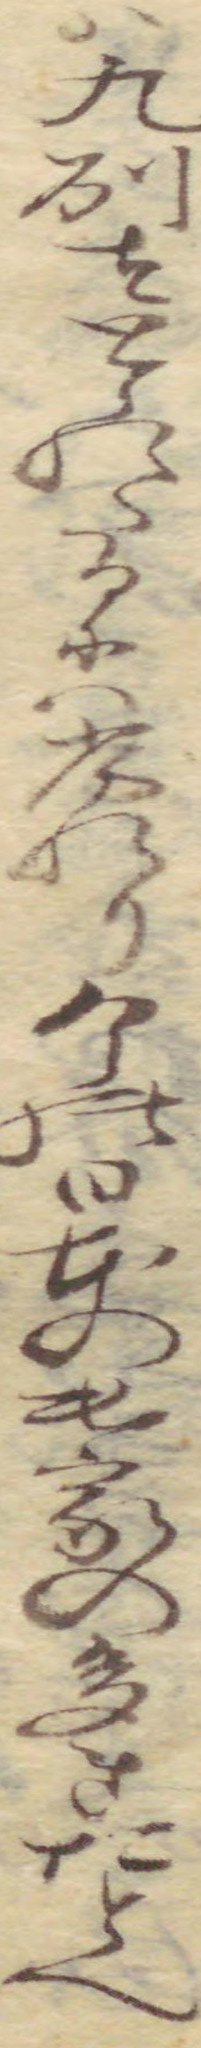は九州をとられたるには劣れり今の日本の出家の多きたとへ
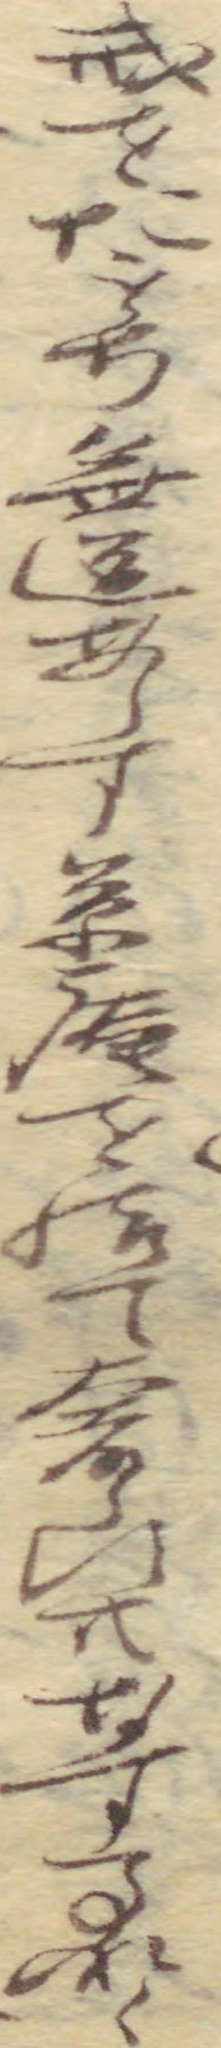戒をたもち無道ならす草庵を結て奢らす共なす事なく
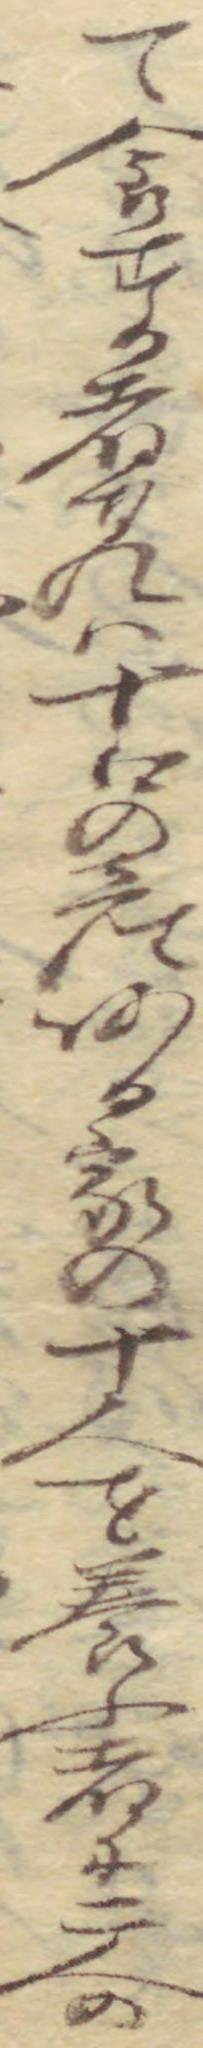て食する者なれは十口の産ある家の十人を養ふ者に二人の
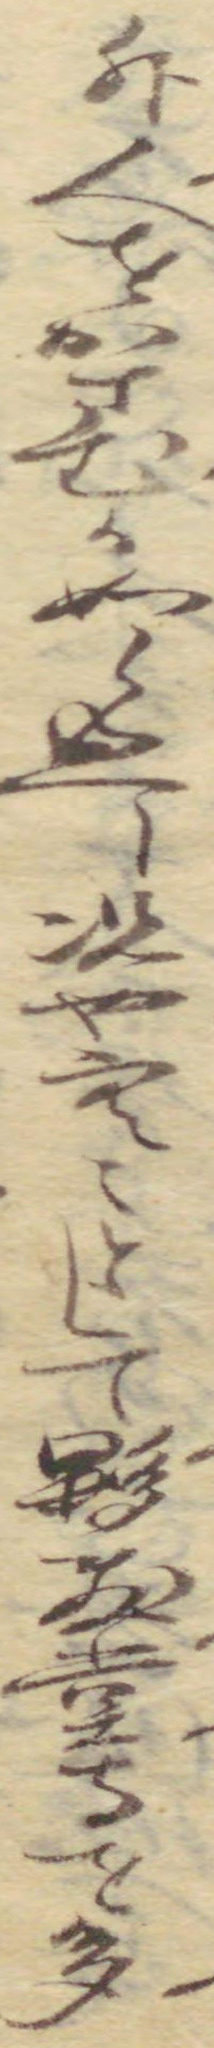外人をかさむか如く成へし況や空〻として夥敷堂寺を多
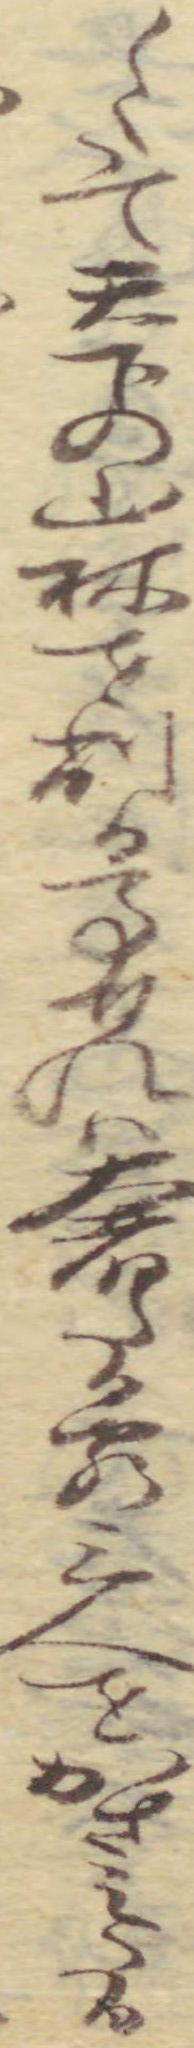くたて天下の山林を削る事なれは奢たる客三人をかさみたる
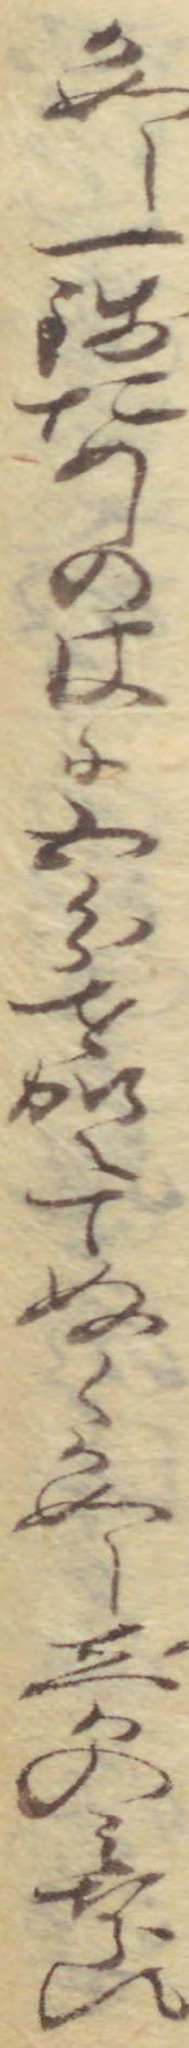か如し一銭ためしの皮に五分を加えてぬくか如ししかのみならす
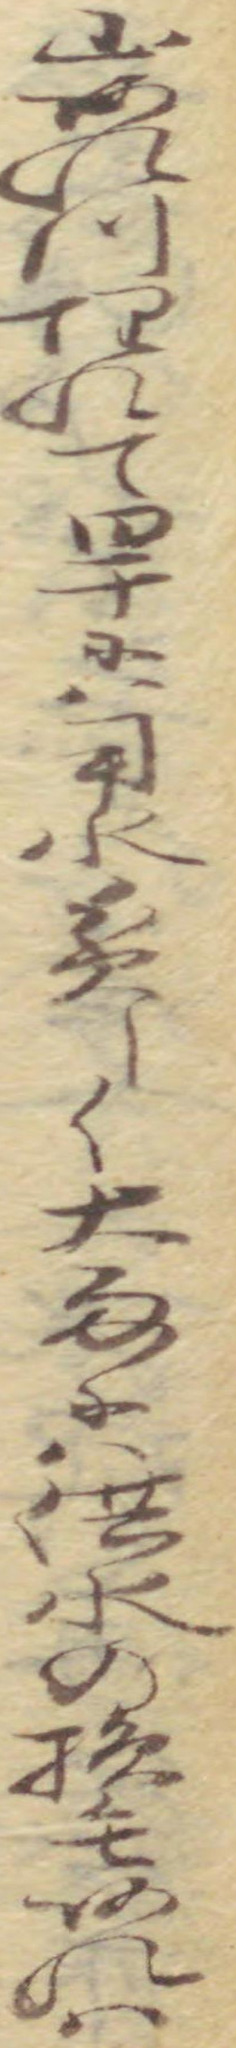山あれ川埋れて旱には用水貧しく大雨には洪水の損毛あれは
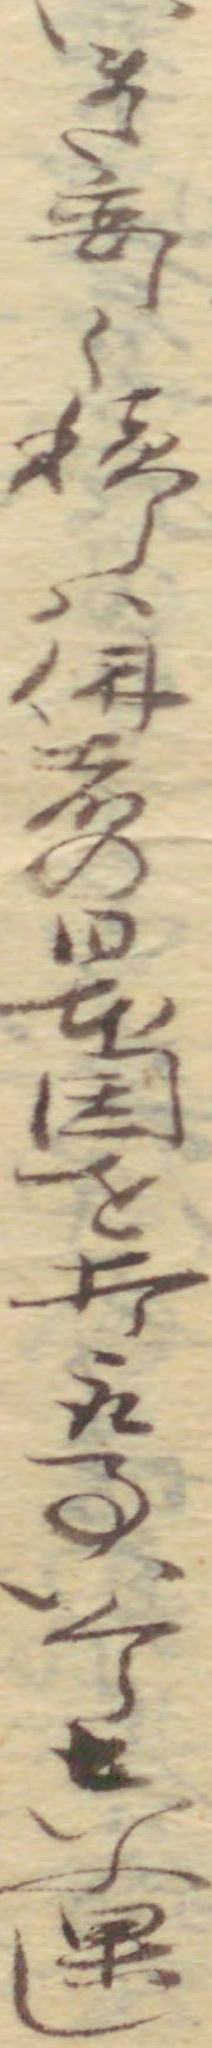いまた委しく積らは仏者の日本国を打取事いくらといふ果し
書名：鶯宿雑記. 巻263-264
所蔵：国立国会図書館 National Diet Library, JAPAN
